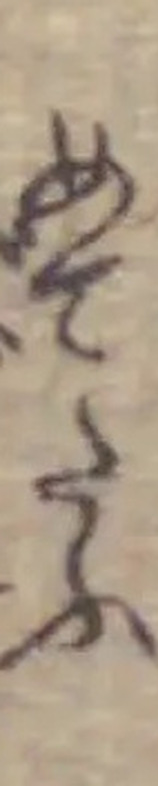めてたふ
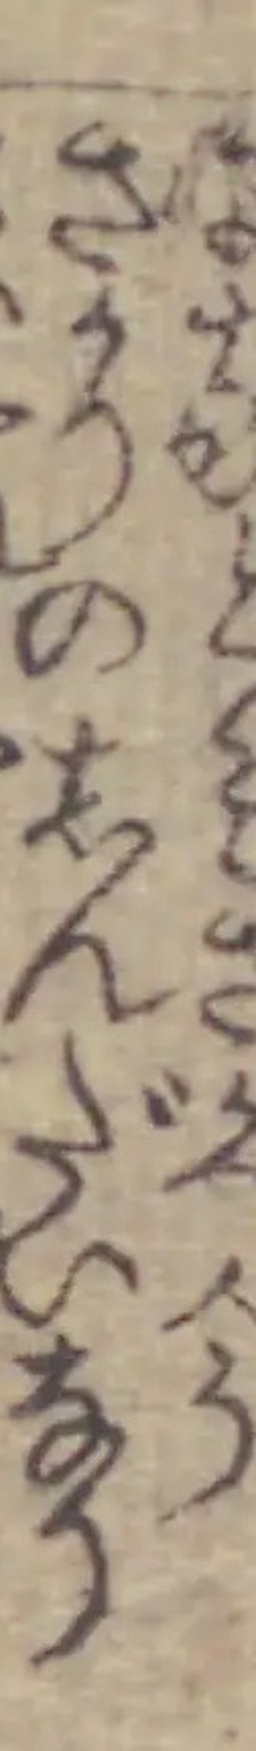さかりのしんだいなり
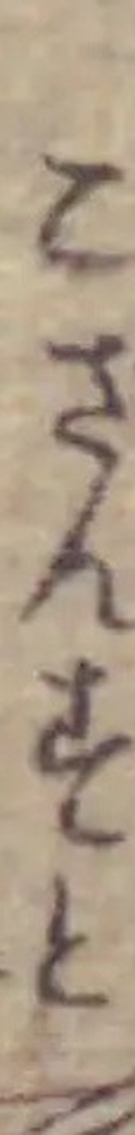ござんすと
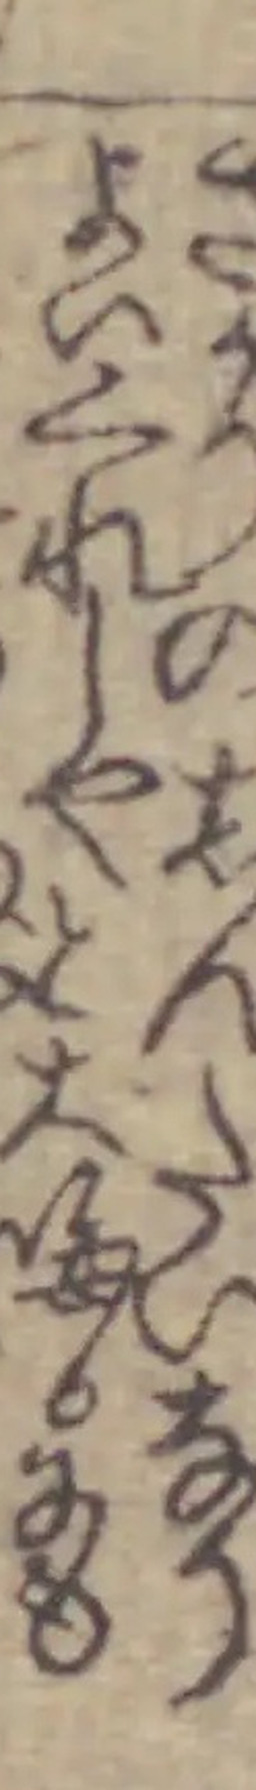よいくれしやと大晦日にも
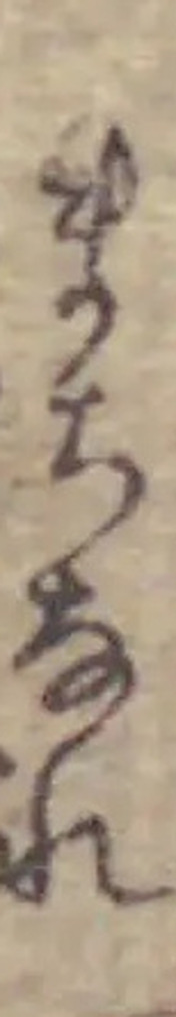まちなれ
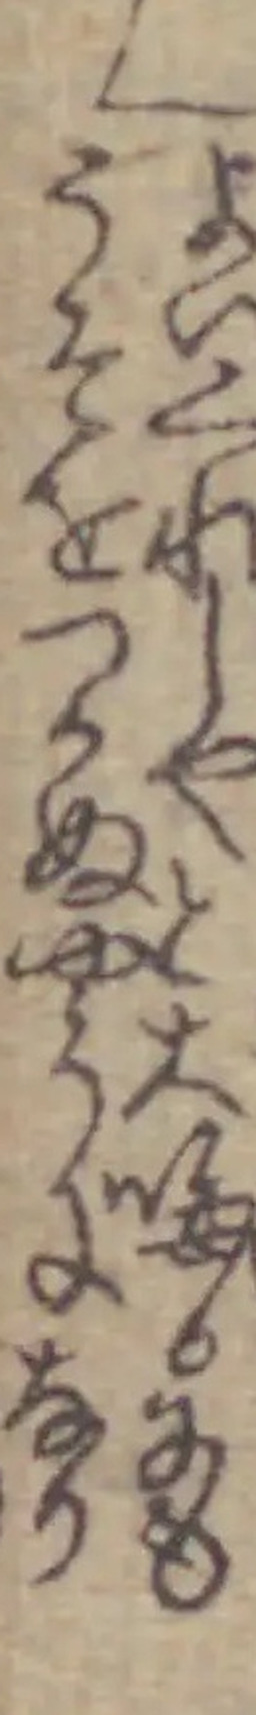うそをつかぬやうになり
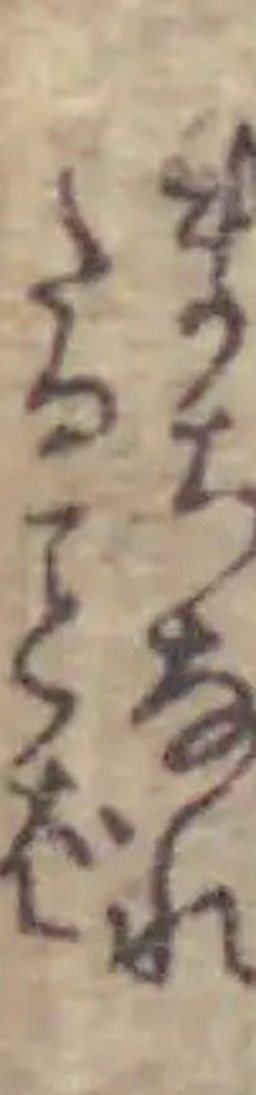たることば
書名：虚言弥二郎傾城誠 3巻
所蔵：国立国会図書館 National Diet Library, JAPAN
